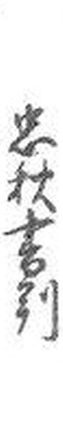忠秋書判
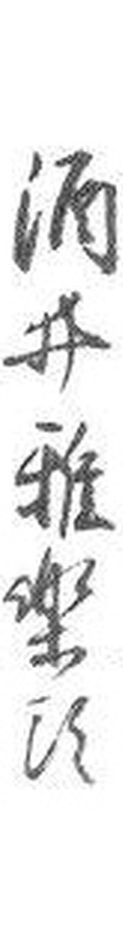酒井雅樂頭
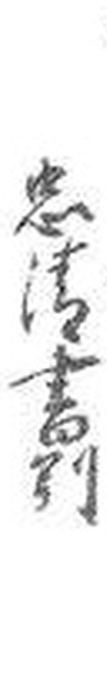忠清書判
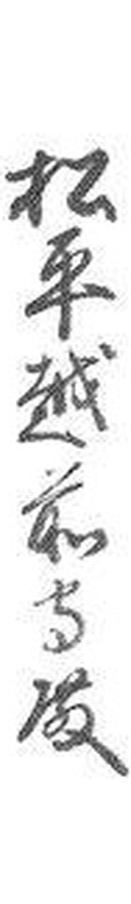松平越前守殿
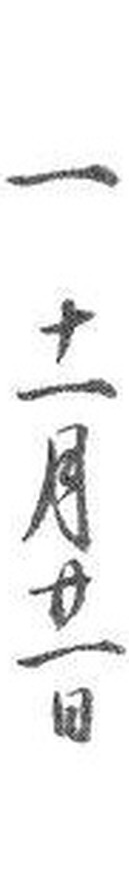一十一月廿一日
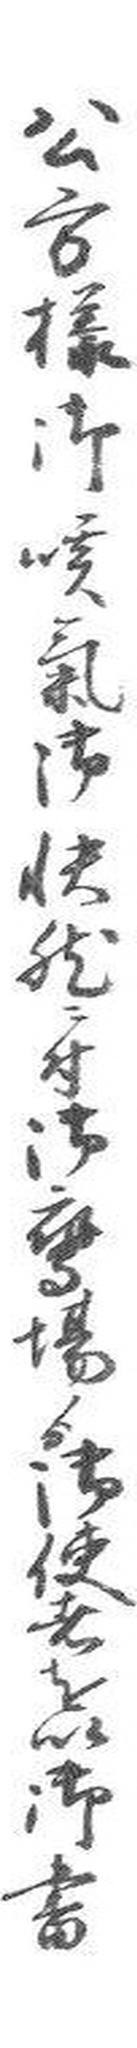公方様御咳気御快然ニ付御鷹場ゟ御使者を以御書
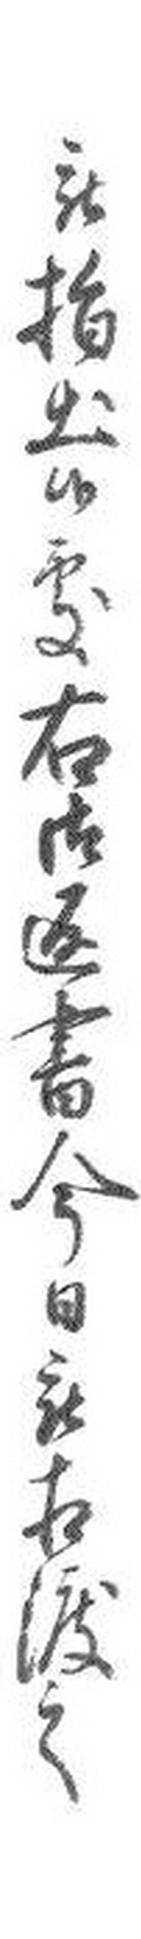被指出候処右御返書今日被相渡之
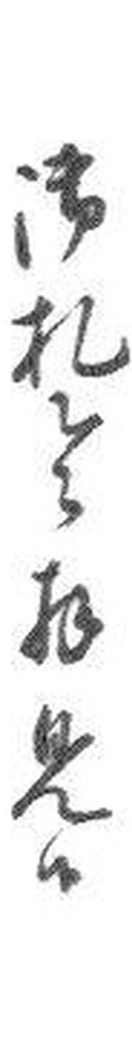御札令拝見候
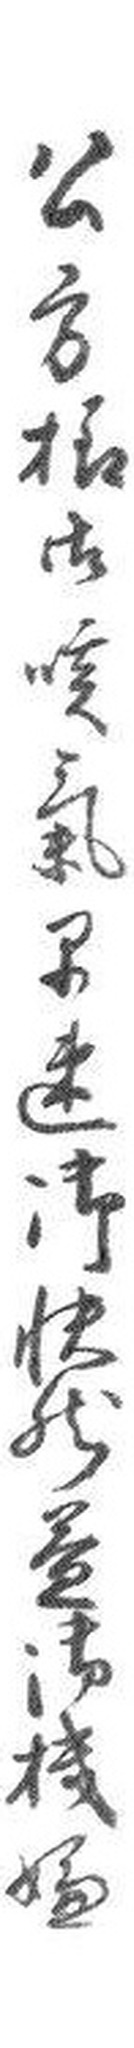公方様御咳気早速御快然益御機嫌
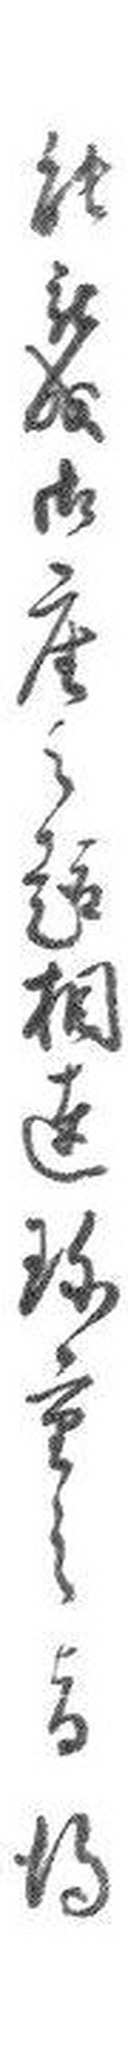能被成御座候趣相達珎重之旨得
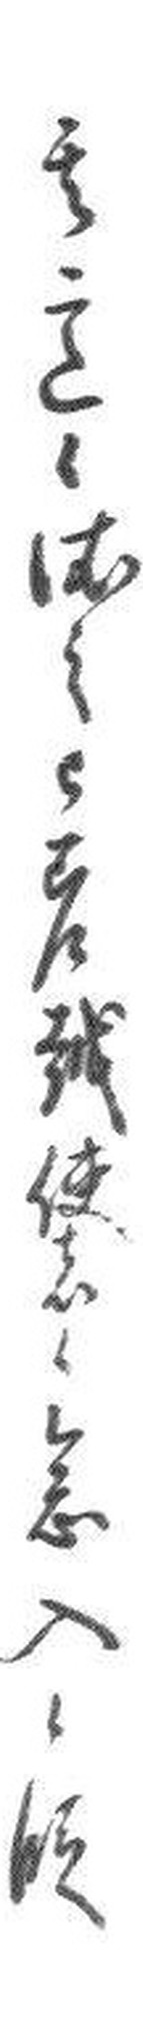其意候依之被差越使者候念入候段
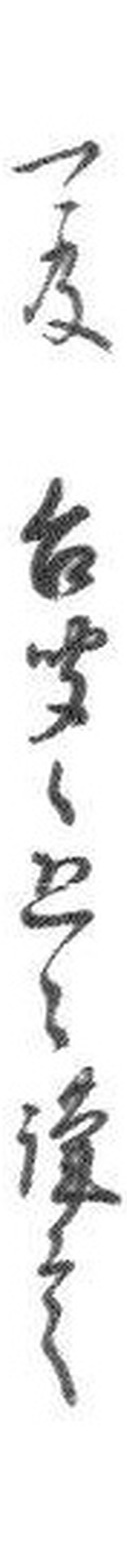可及台聞候恐々謹言
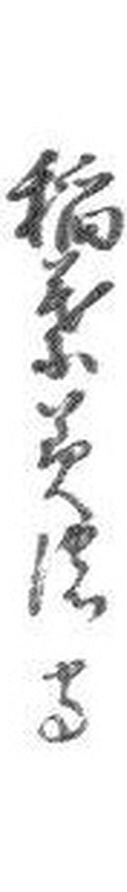稲葉美濃守
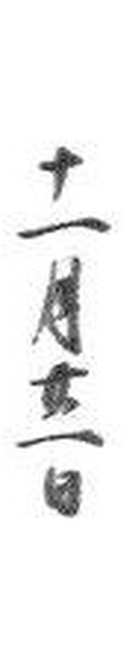一十一月廿一日
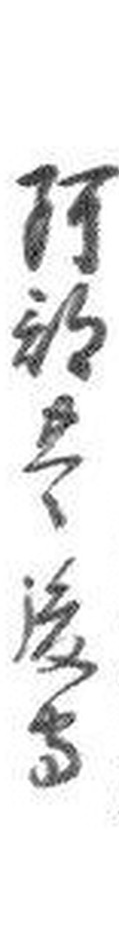阿部豊後守
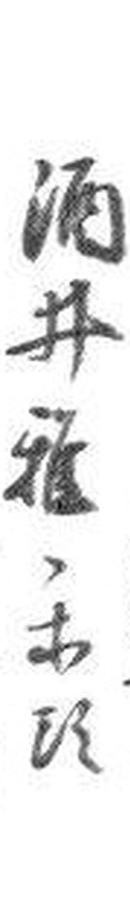酒井雅樂頭
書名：家譜 六 光通公 従万治三年到寛文三年
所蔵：福井県文書館 Fukui Prefectural Archives
